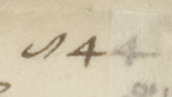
144
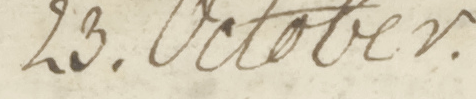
23. October.
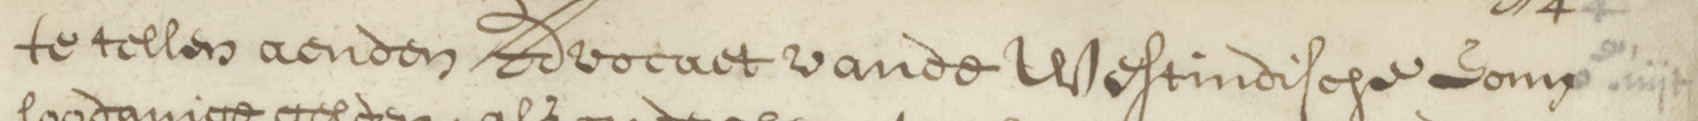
te tellen aenden Advocaet vande Westindische Compe uijt
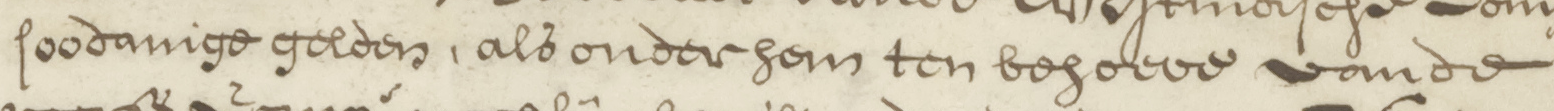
soodanige gelden, als onder hem ten behoeve vande
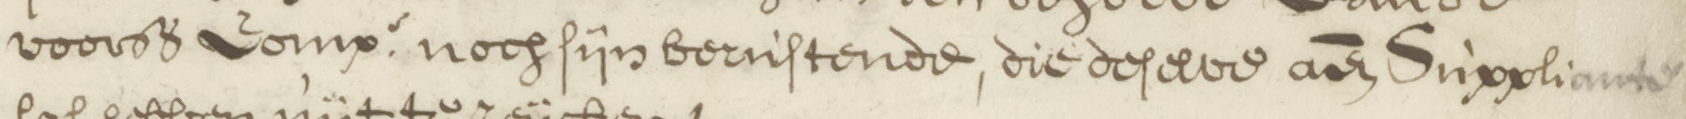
voors Compe noch sijn berustende, die deselve aen Suppliante
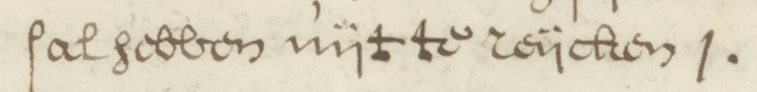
sal hebben uijt te reijcken.
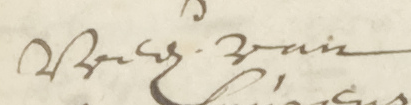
Wede. van
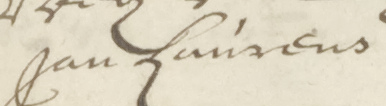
Jan Laurens
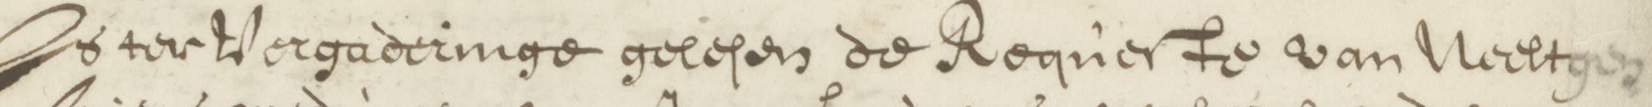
Is ter Vergaderinge gelesen de Requeste van Neeltgen
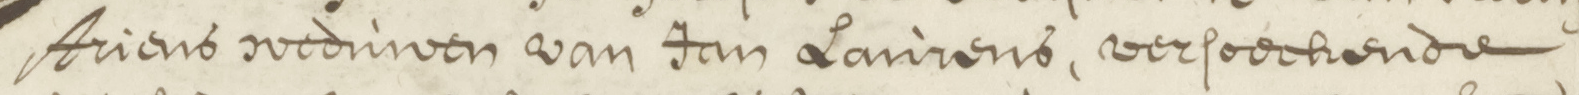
Ariens weduwen van Jan Laurens, versoeckende
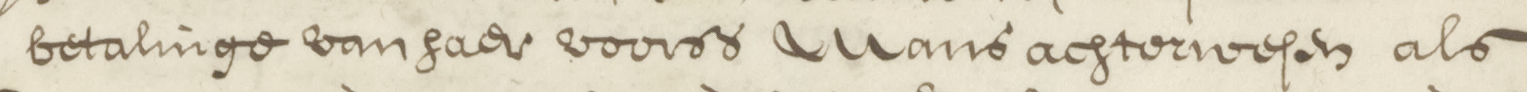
betalinge van haer voors Mans achterwesen als
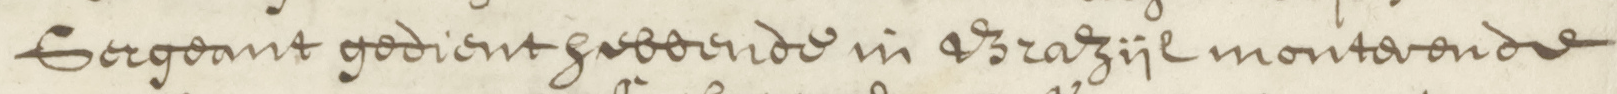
Sergeant gedient hebbende in Brazijl monterende
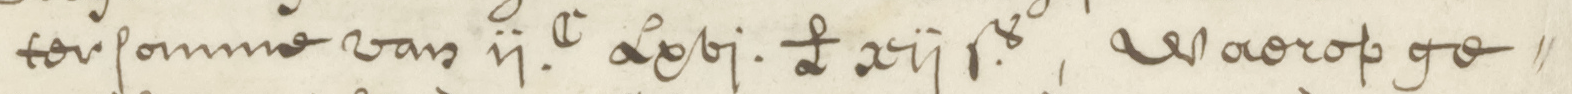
ter somme van iic lxvi. L. xii ss. Waerop ge,,
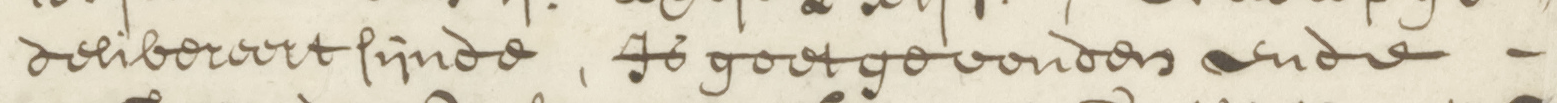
delibereert sijnde, Is goetgevonden ende ¬
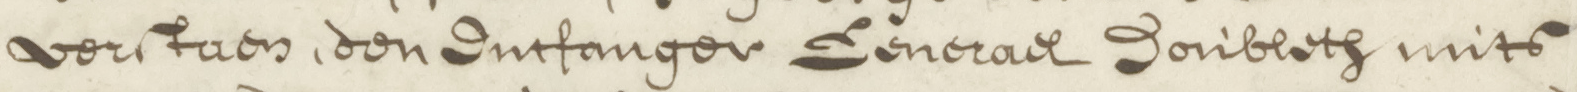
verstaen, den Ontfanger Generael Doubleth mits
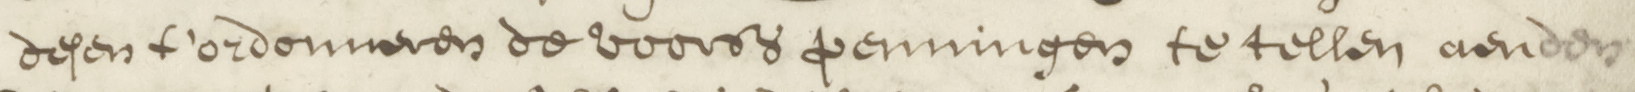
desen t'ordonneren de voors penningen te tellen aenden
